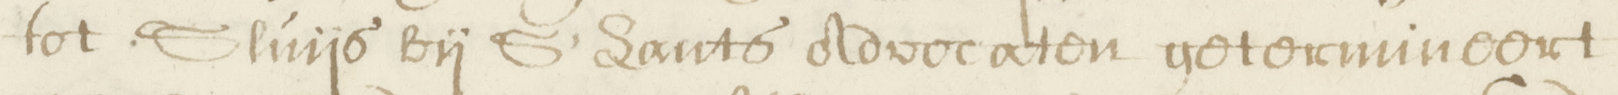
tot Sluijs bij S'Lants Advocaten getermineert
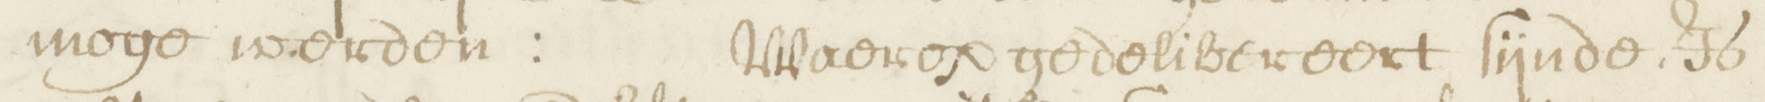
moge werden: Waerop gedelibereert sijnde, Is
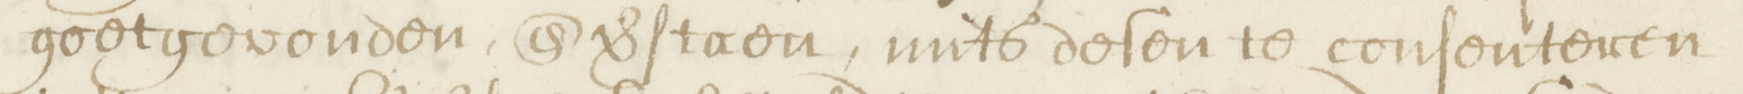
goetgevonden, & vstaen, mits desen te consenteren
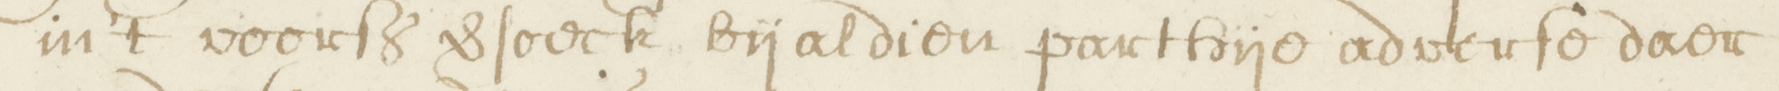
in't voors vsoeck bij aldien parthije adverse daer
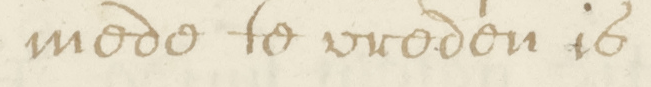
mede te vreden is
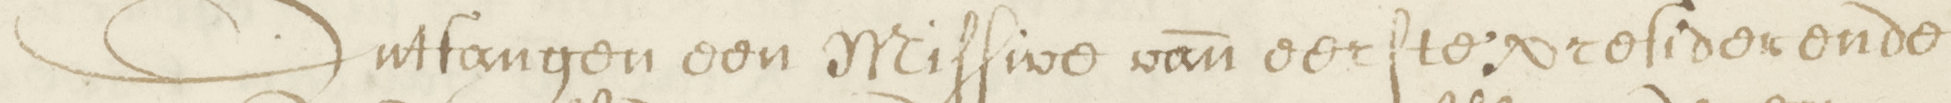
Ontfangen een Missive van eerste presiderende
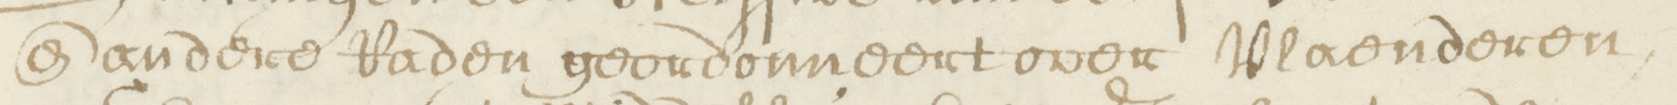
& andere Raden geordonneert over Vlaenderen,
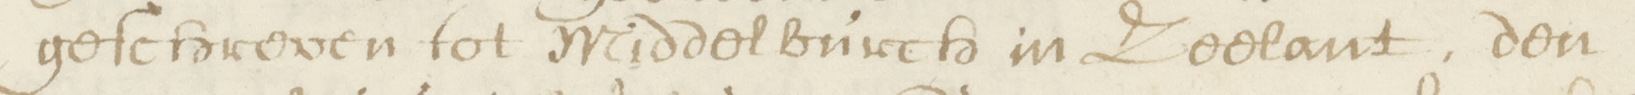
geschreven tot Middelburch in Zeelant, den
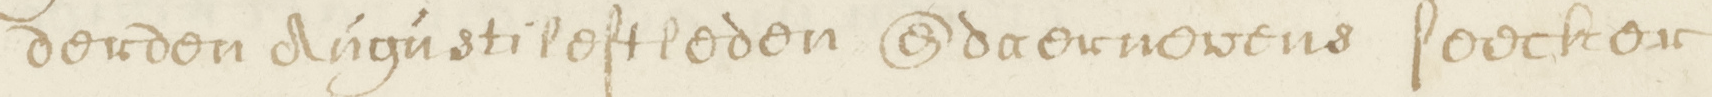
derden Augusti lestleden & daernevens seecker
